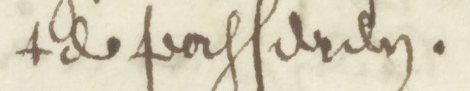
te passeren.
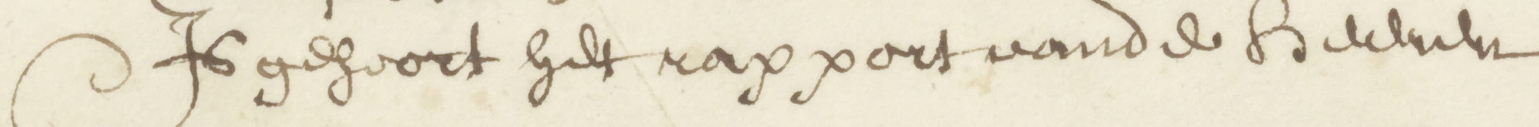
Is gehoort het rapport vande Heeren
